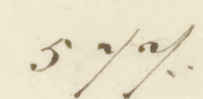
577.
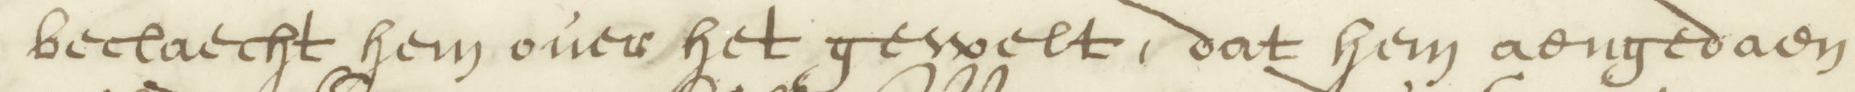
beclaecht hem over het gewelt, dat hem aengedaen
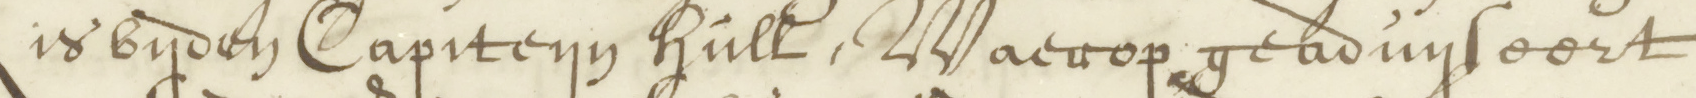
is byden Capiteijn Hull. Waerop geaduyseert
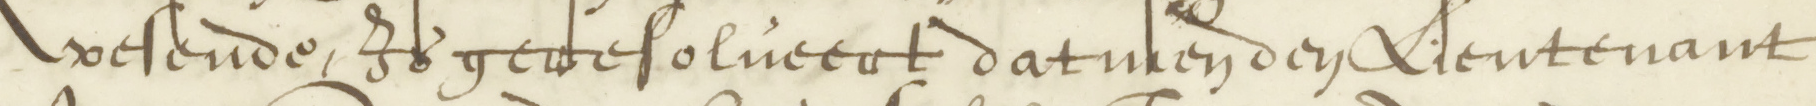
wesende, is geresolueert dat men den Lieutenant
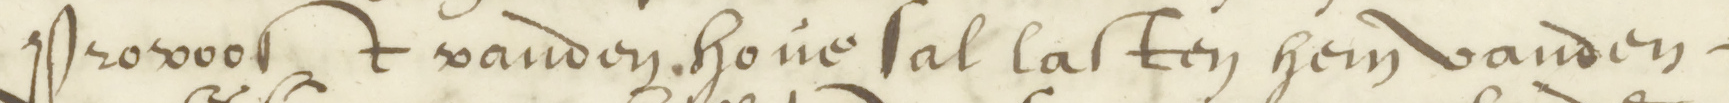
Provoost vanden Houe sal lasten hem vanden
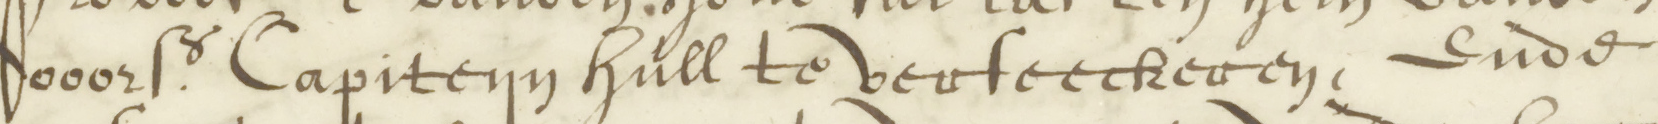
voors. Capiteyn Hull te verseeckeren, ende
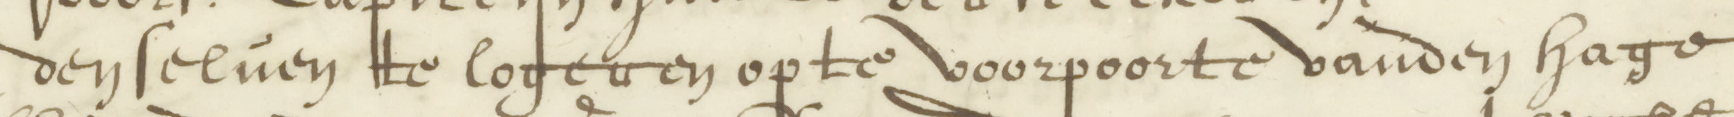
den selven te logeren op te voorpoorte vanden Hage
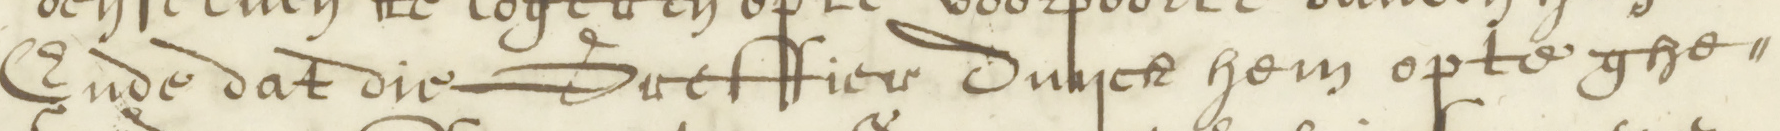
Ende dat die Grefffier Duyck hem opte ghe„
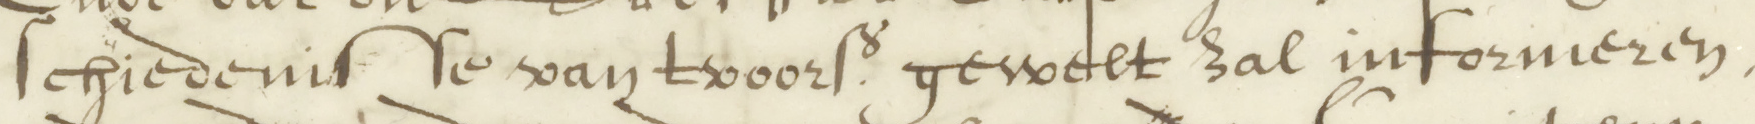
schiedenisse vant voors. gewelt zal informeren
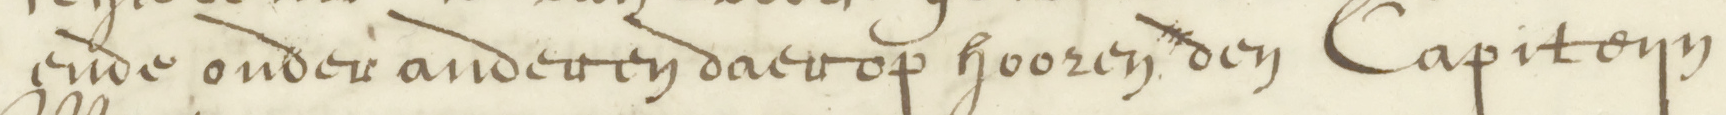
ende onder anderen daerop hooren den Capiteyn
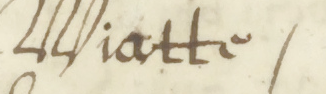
Wiatte.
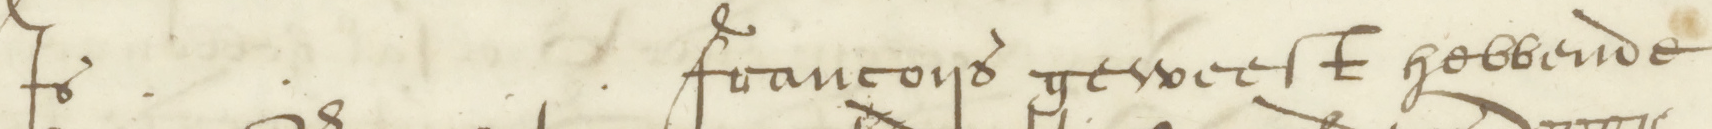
Is . . . . . Francoys geweest hebbende
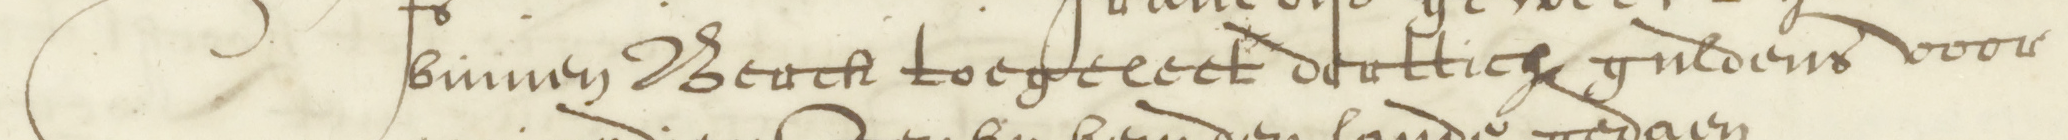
binnen Berck toegeleet derttich guldens voor
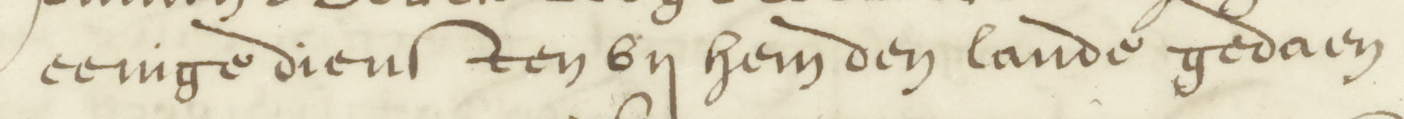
eenige diensten by hem den lande gedaen
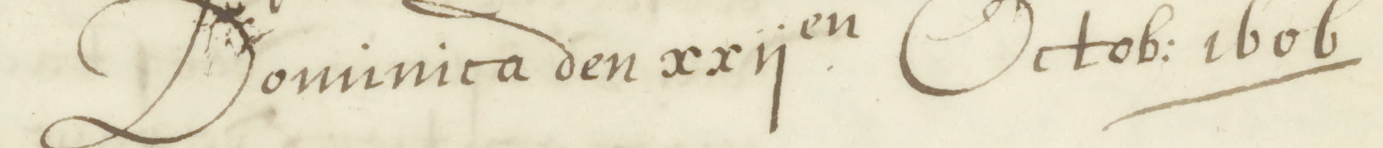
Dominica den xxijen Octob: 1606
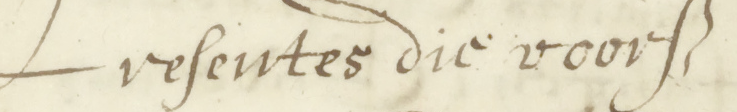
Presentes die voors
